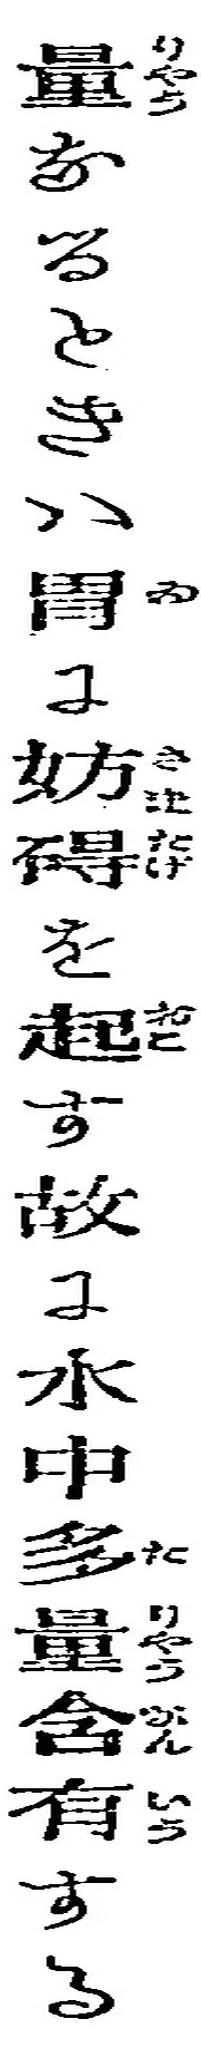量なるときは胃に妨碍を起す故に水中多量含有する

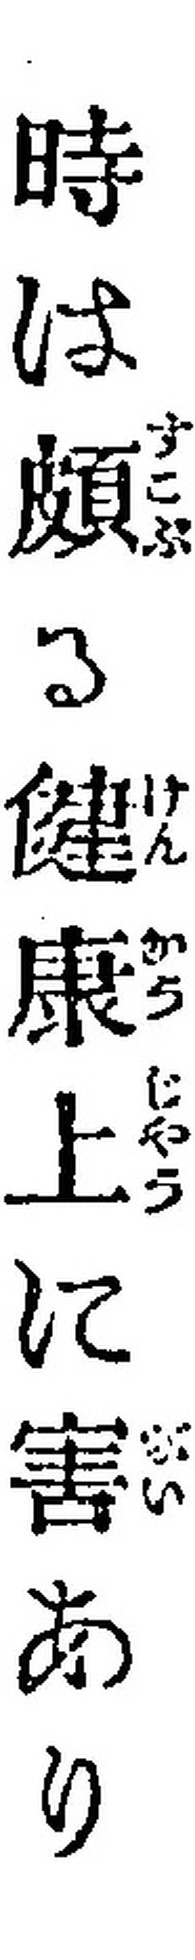時は頗る健康上に害あり
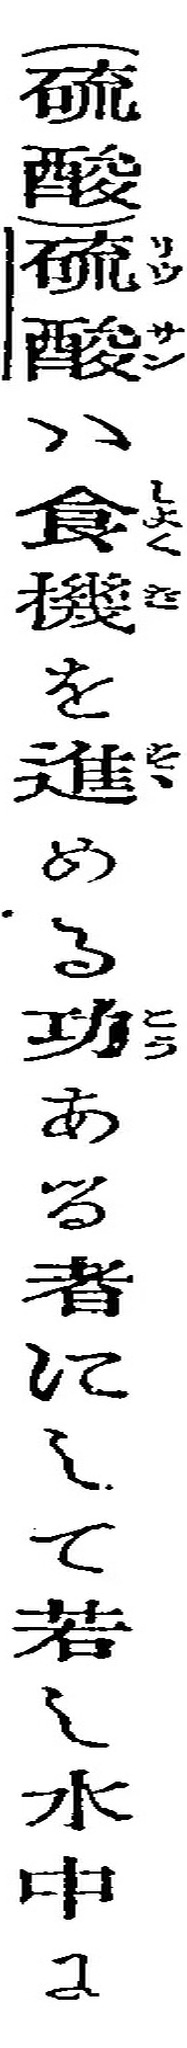[硫酸]硫酸は食気を進める功ある者にして若し水中に
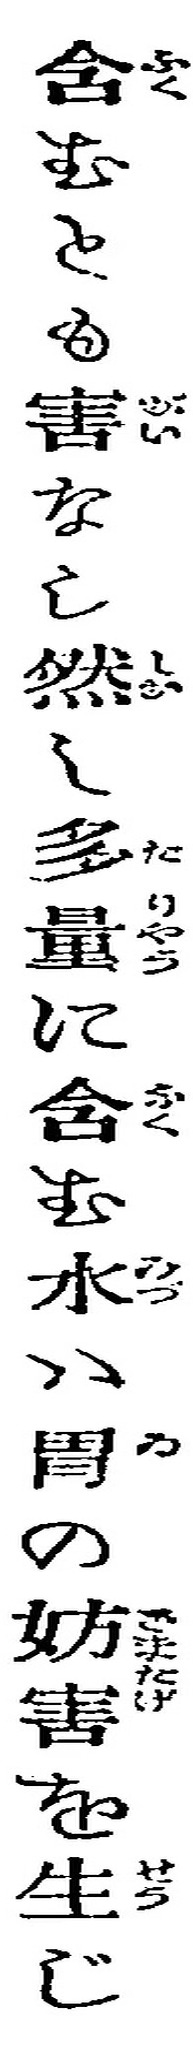含むとも害なし然し多量に含む水は胃の妨害を生じ
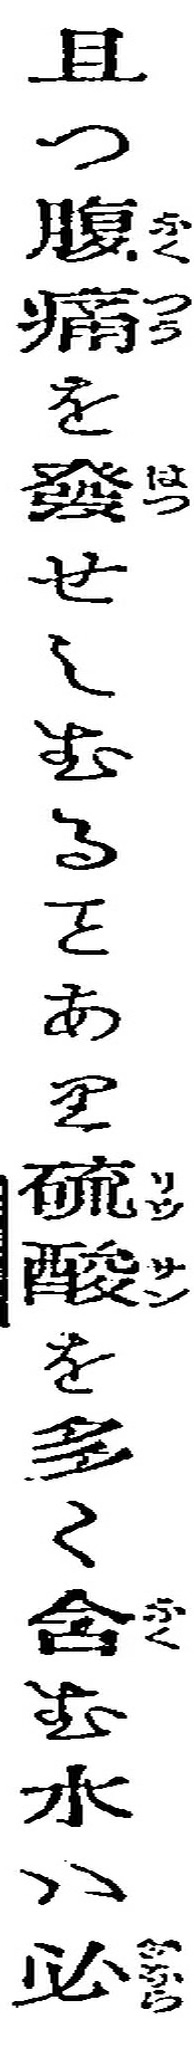且つ腹痛を發せいむることあり硫酸を多く含む水は必
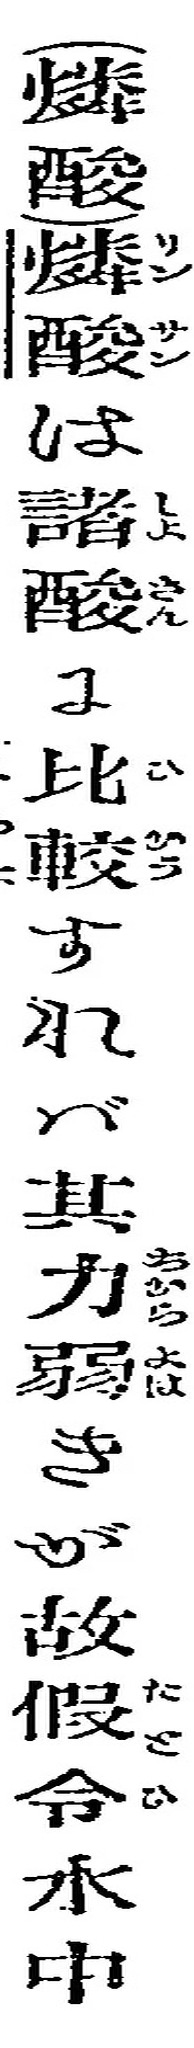[燐酸]燐酸は諸酸に比較すれば其力弱きが故假令水中
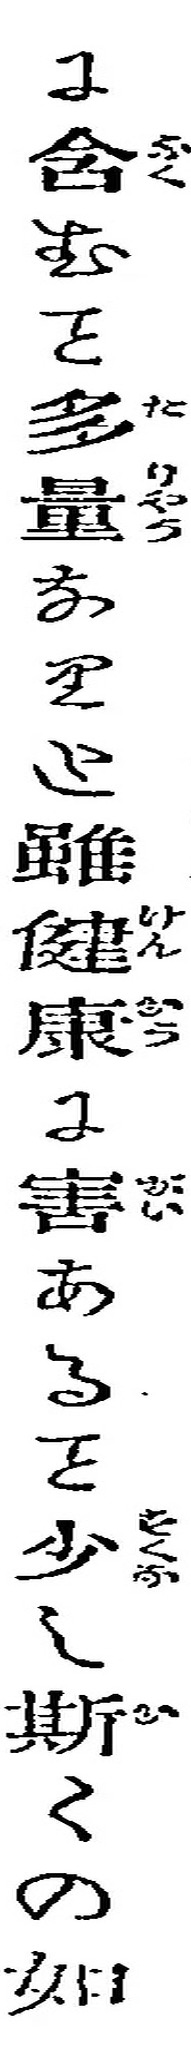に含むこと多量なりと雖健康に害あること少し斯くの如
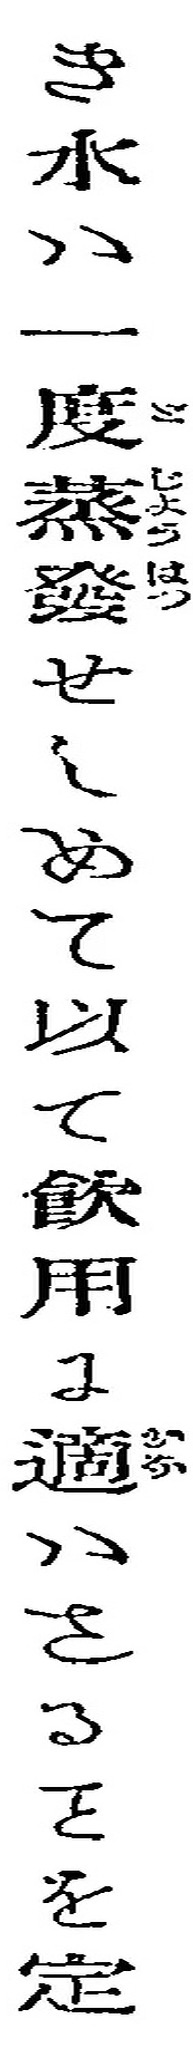き水は一度蒸發せしめて以て飲用に適はさることを定
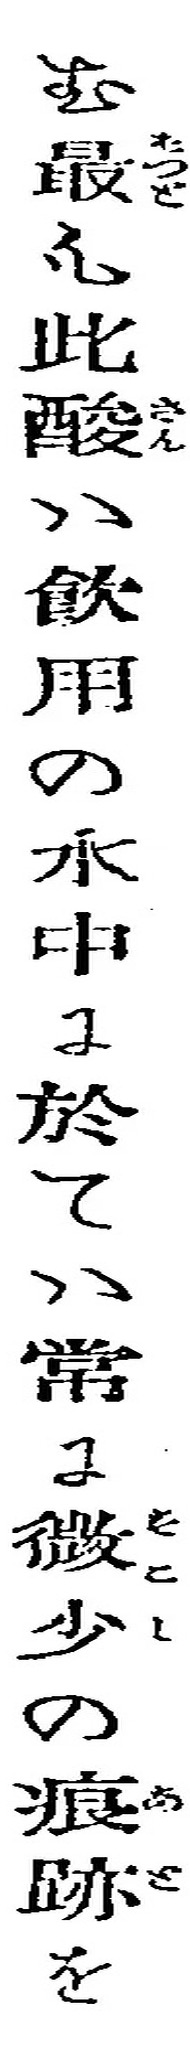む最も此酸は飲用の水中に於ては常に微少の痕跡を
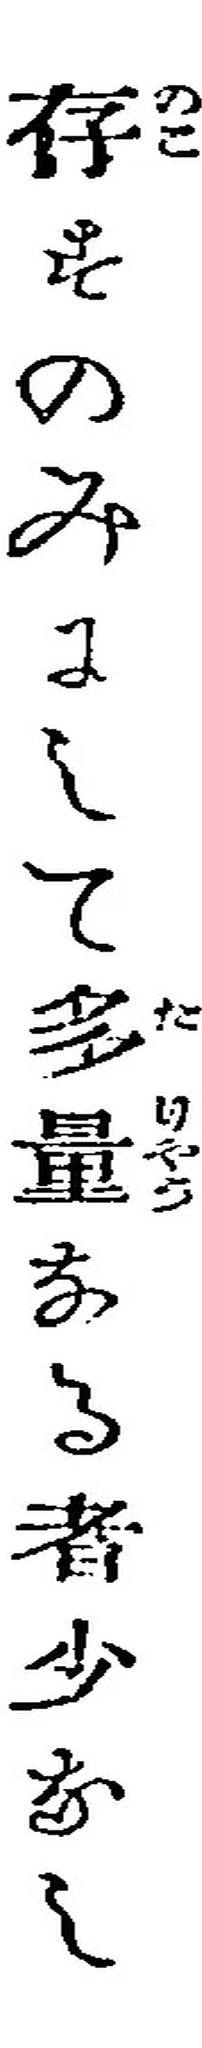存すのみにして多量なる者少なし
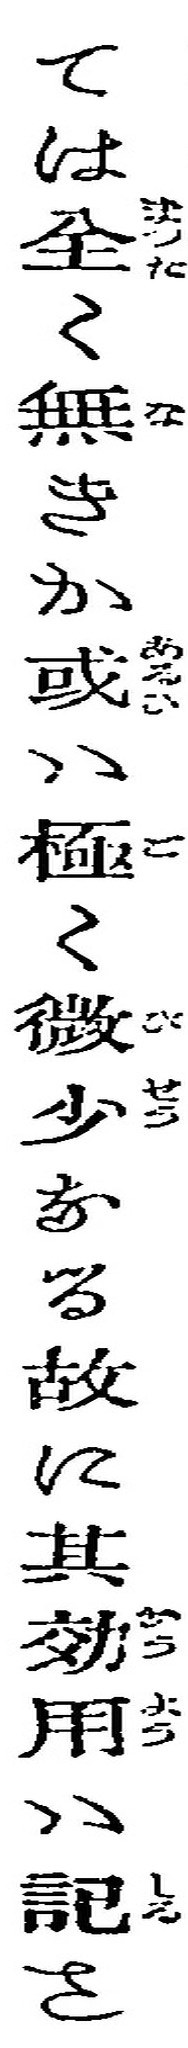ては全く無きか或は極く微少なる故に其効用は記さ
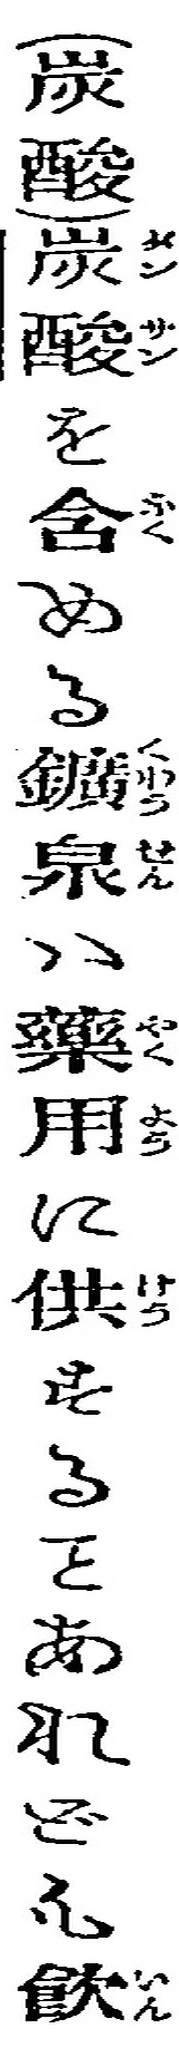[炭酸]炭酸を含める鑛泉は薬用に供することあれども飲
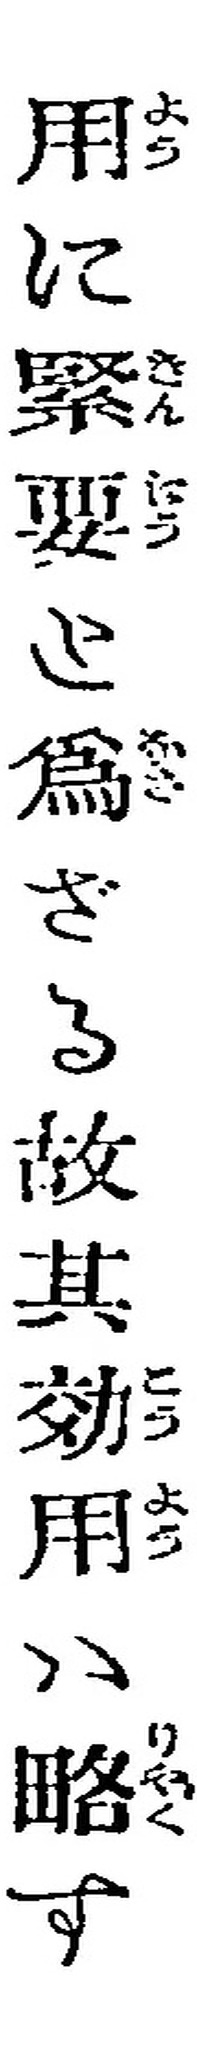用に緊要と為ざる故其効用は略す
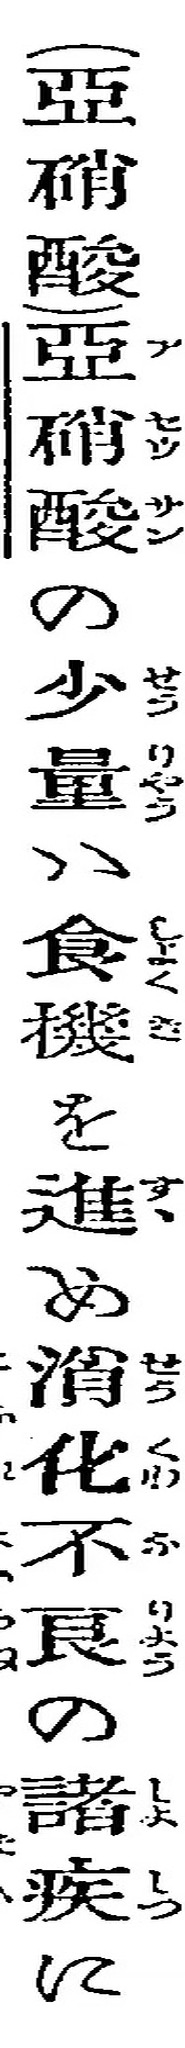[亞硝酸]亞硝酸の少量は食機を進め消化不良の諸疾に
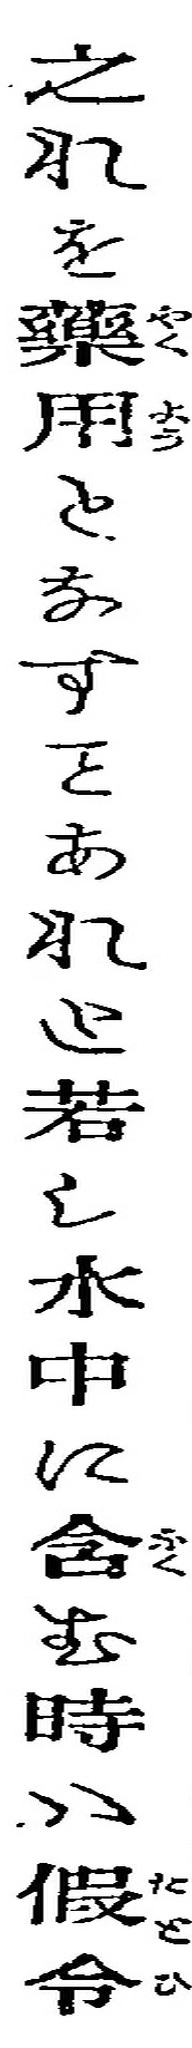之れを薬用となすことあれと若し水中に含む時は假令
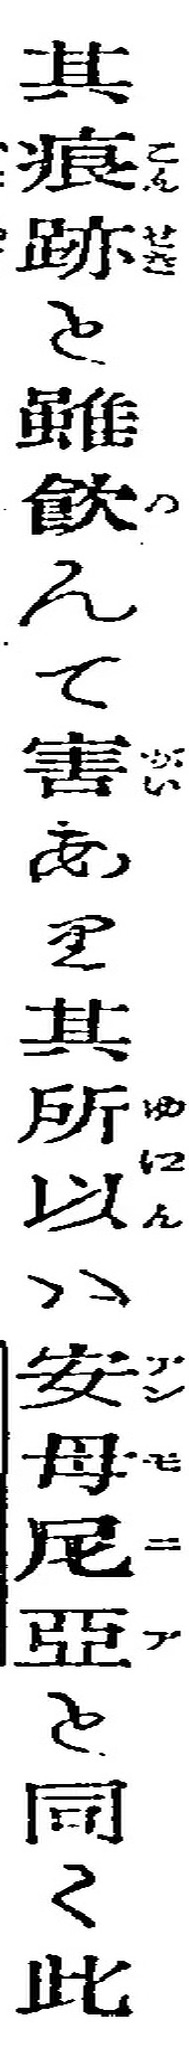其痕跡と雖飲んて害あり其所以は安母尼亞と同く此
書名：飲水の心得 : 伝染病の予防
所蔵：国立国会図書館 National Diet Library, JAPAN
